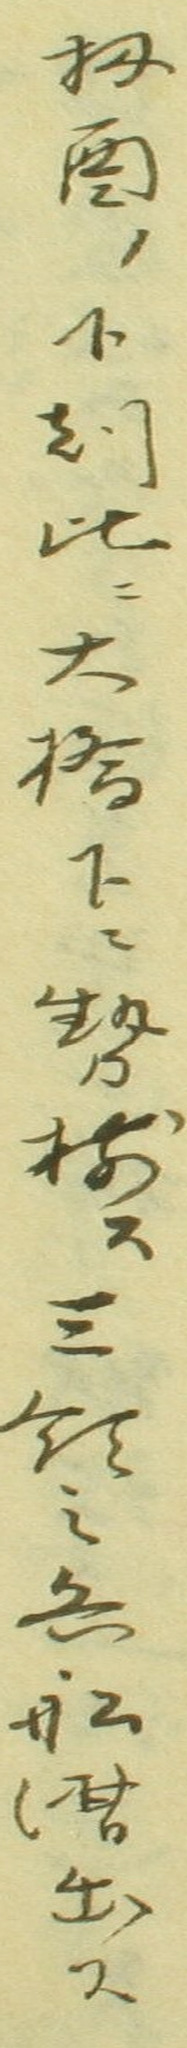扨酉ノ下刻頃ニ大橋下ニ勢揃ス三領之兵船漕出ス
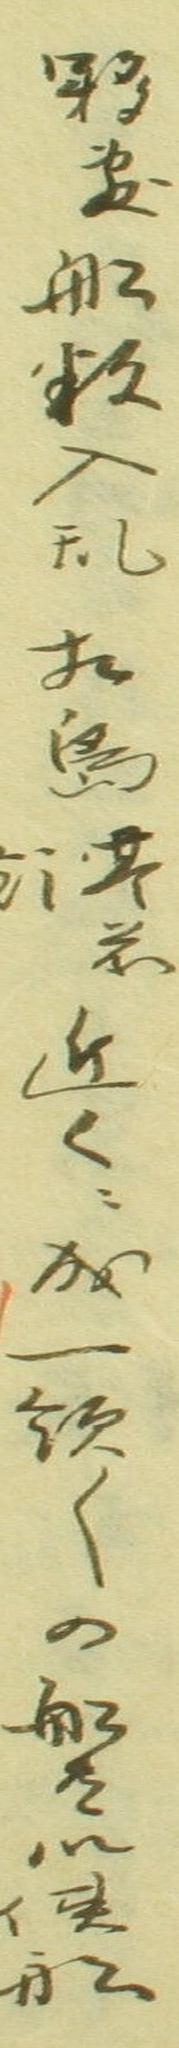夥敷船数入乱相島豊前領近くニ成一領〳〵の船共以使船
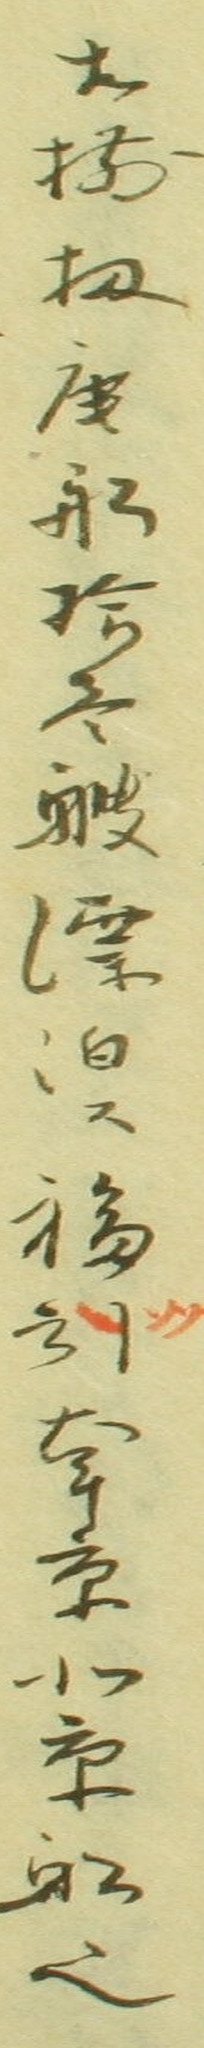相揃扨唐船拾壱艘漂泊ス福州京北京船也
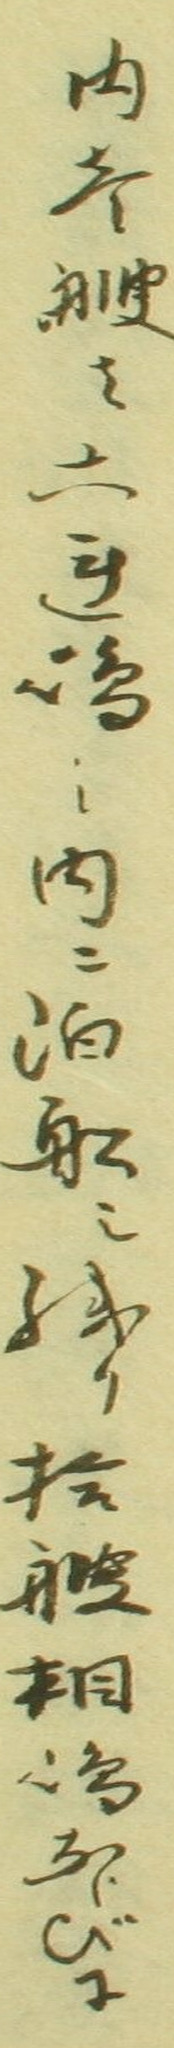内壱艘は六連島之内ニ泊船し残り拾艘相島ならびに
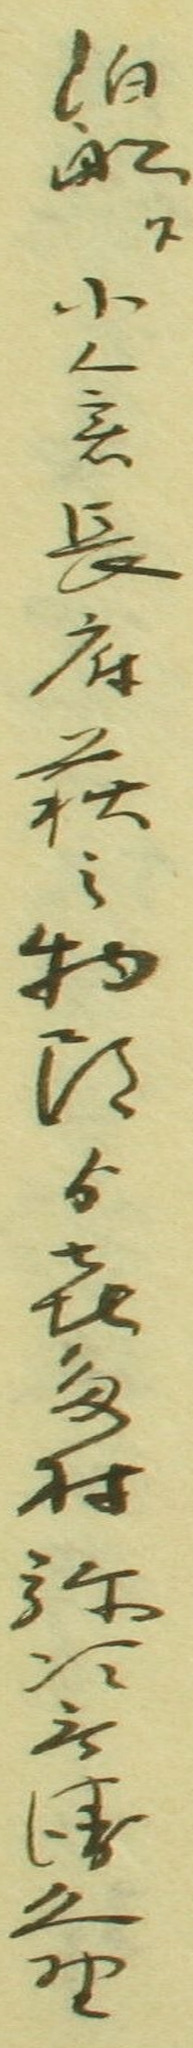泊船ス小倉長府萩之物頭ゟ喜多村弥次兵衛久野
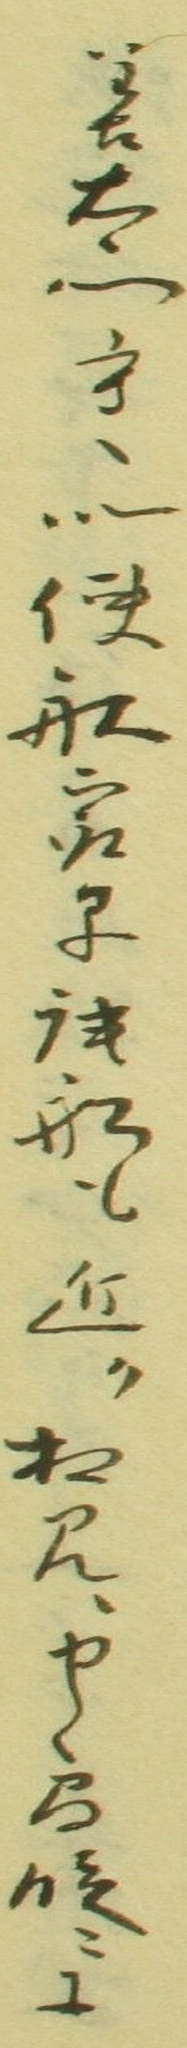善右衛門方へ以使船最早唐船も近く相見へ申候間段々に

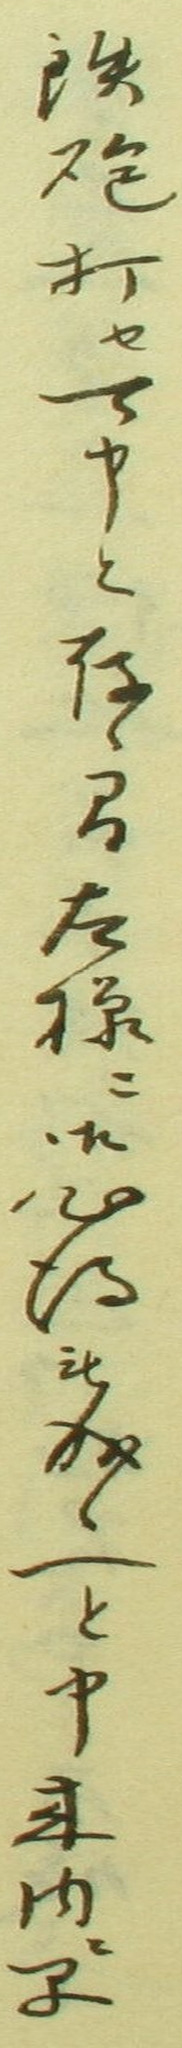鉄砲打セ可申と存候間左様ニ御心得被成候へと申来内ニ早
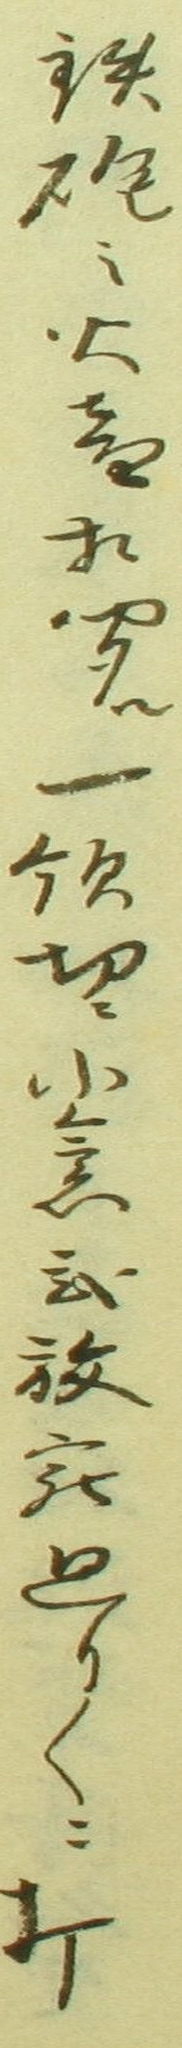鉄砲之火音相聞候一領切ニ小倉弐放宛廻り〳〵ニ打
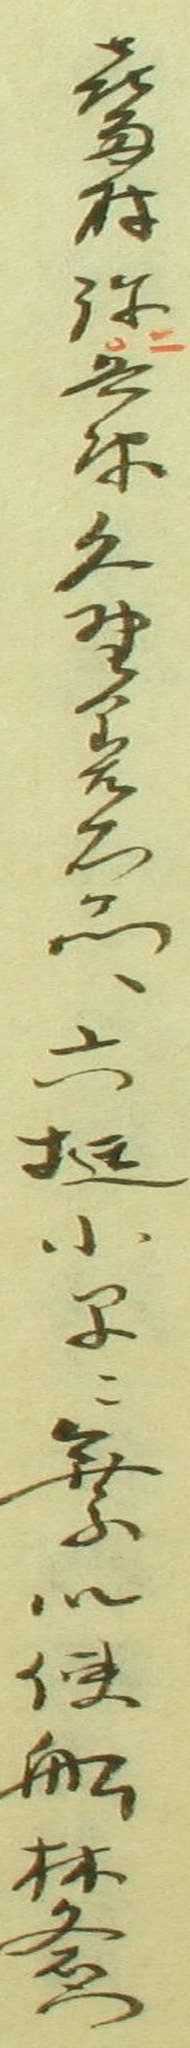喜多村弥次兵衛久野善右衛門へ六挺小早ニ乗以使船林文右衛門
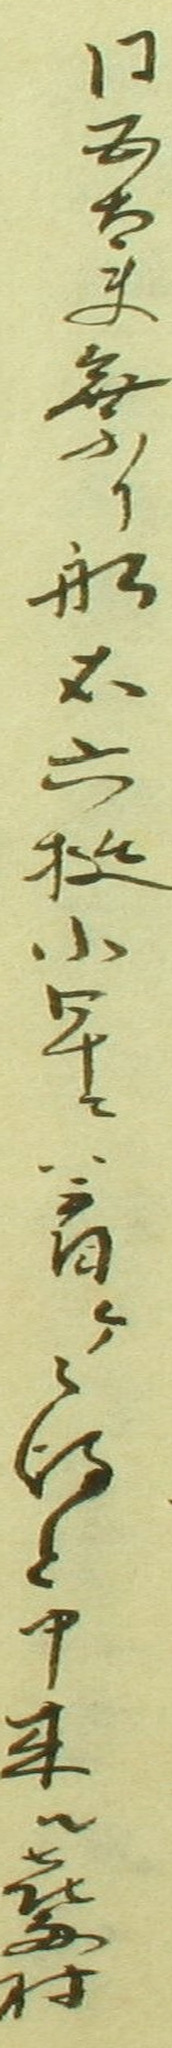同五太夫乗り船右六挺小早ニ着ケ候得と申来候喜多村
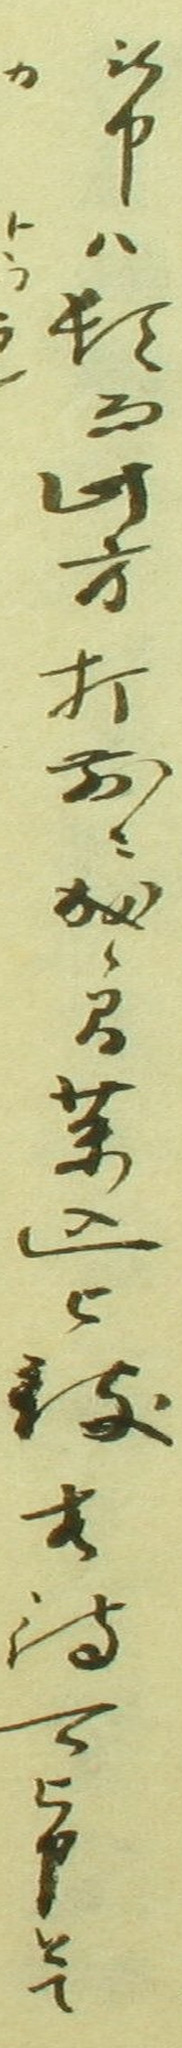被申ハ頓而此方打前ニ成候間薬込被致相待可被申とて
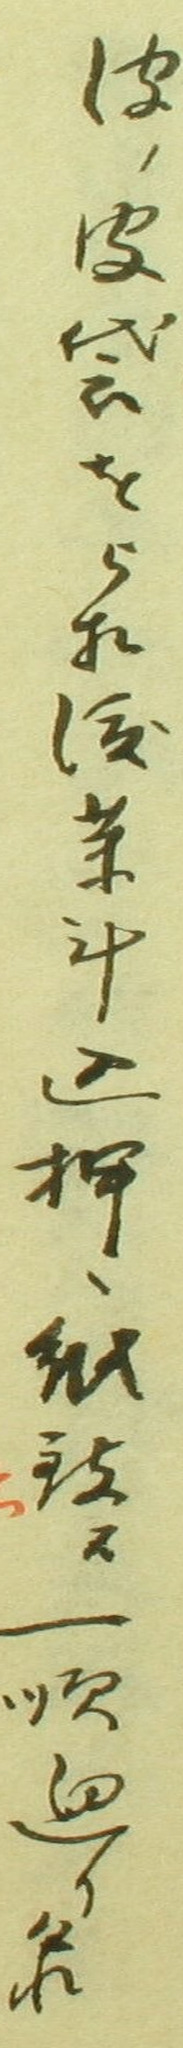皮ノ皮袋を被相渡薬斗込押へ紙致ス一順廻りけれ
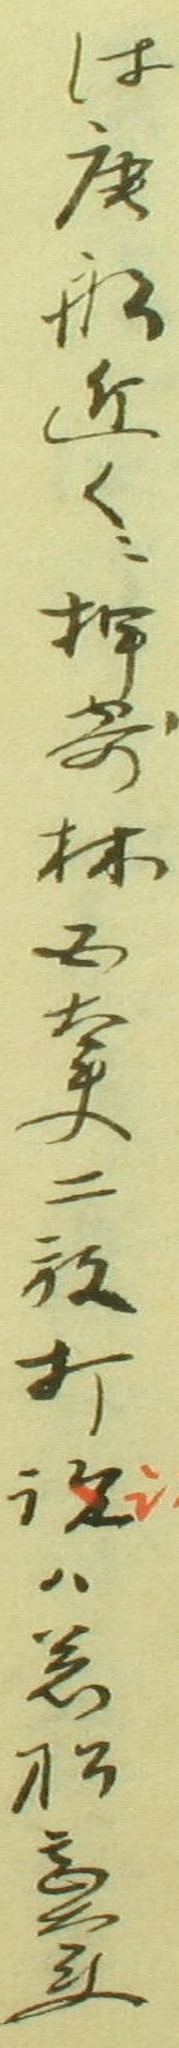は唐船近くニ押寄林五太夫二放打跡ハ若松甚太夫
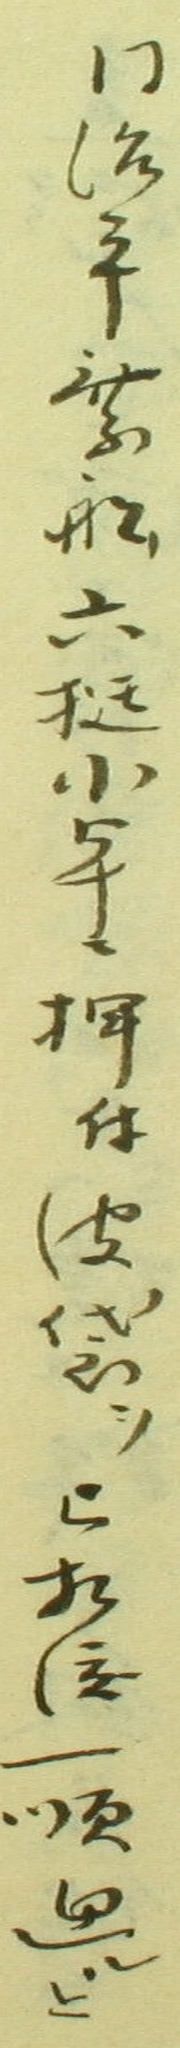同治平乗船六挺小早ニ押付皮袋ヲ被相渡一順廻ルと
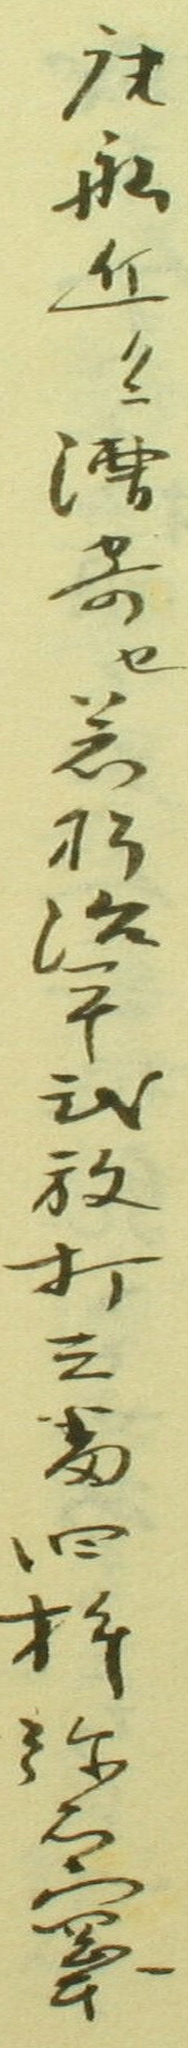唐船近くニ漕寄セ若松治平弐放打三番臼杵弥右衛門岡本
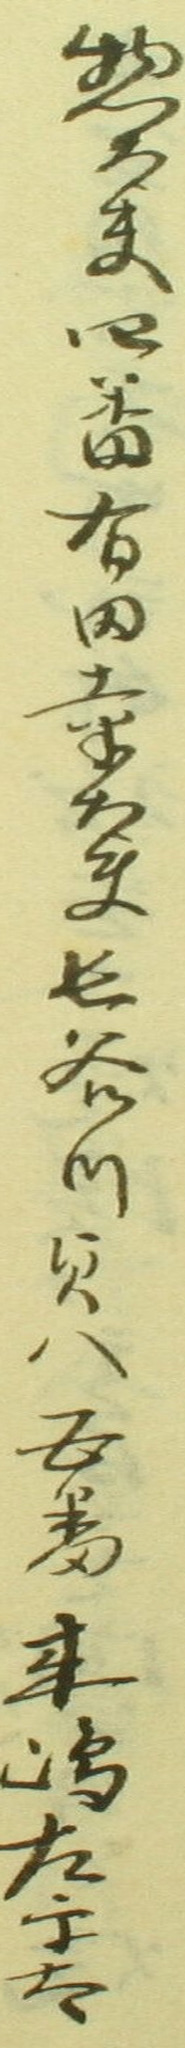惣太夫四番有田幸太夫長谷川貞八五番来島佐平太
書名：唐船漂流記 二
